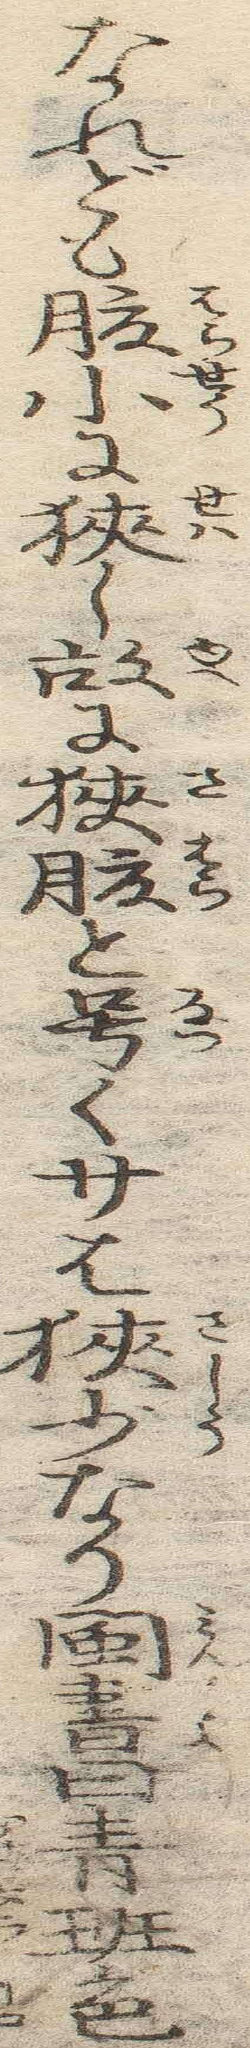なれども腹小に狭し故に狭腹と号くサは狭少なり閩書曰青班色
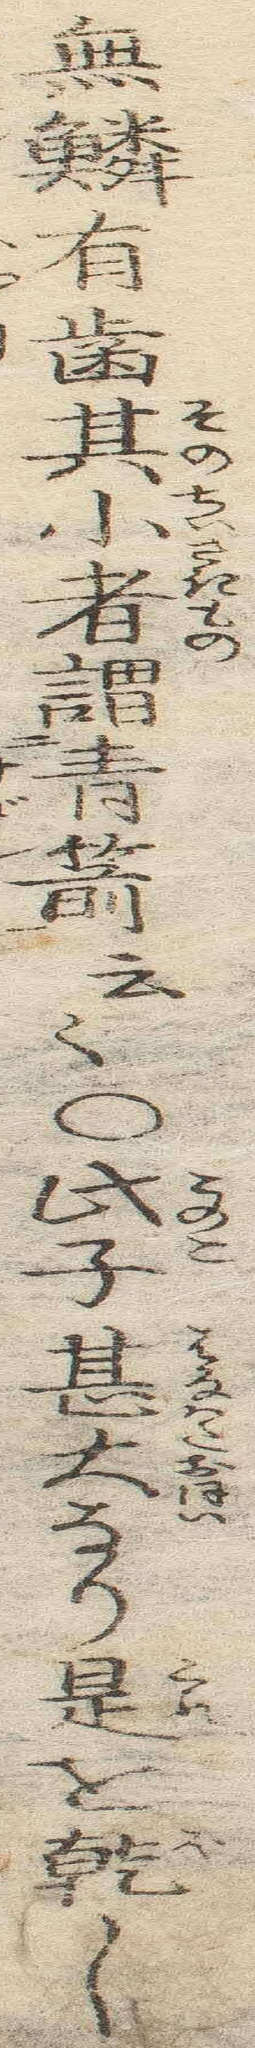無鱗有歯其小者謂青箭云々○此子甚大なり是を乾し
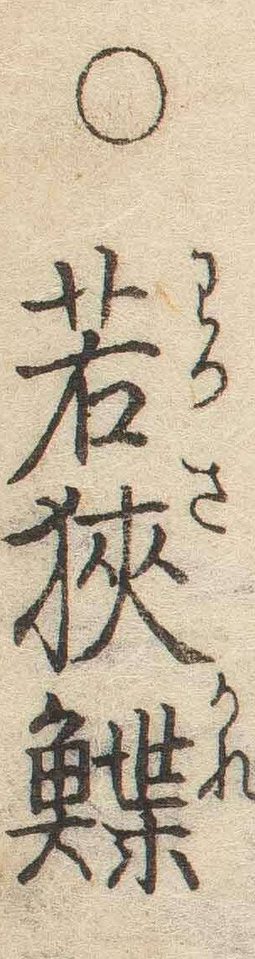○若狭鰈

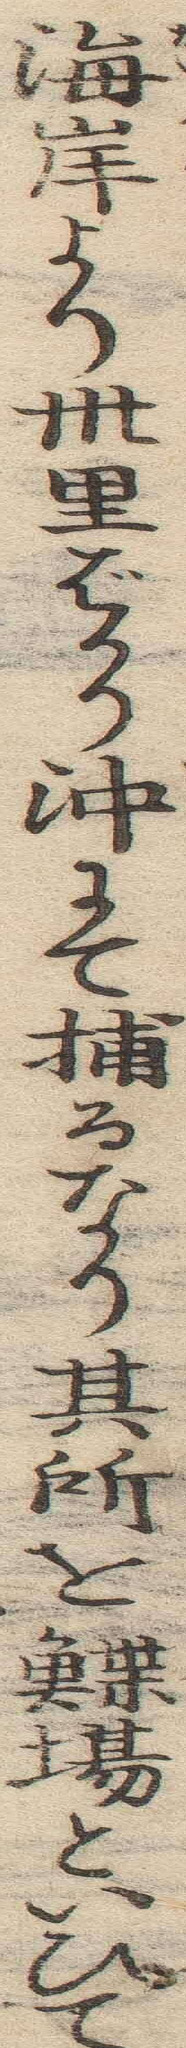海岸より卅里ばかり沖にて捕るなり其所を鰈場といひて
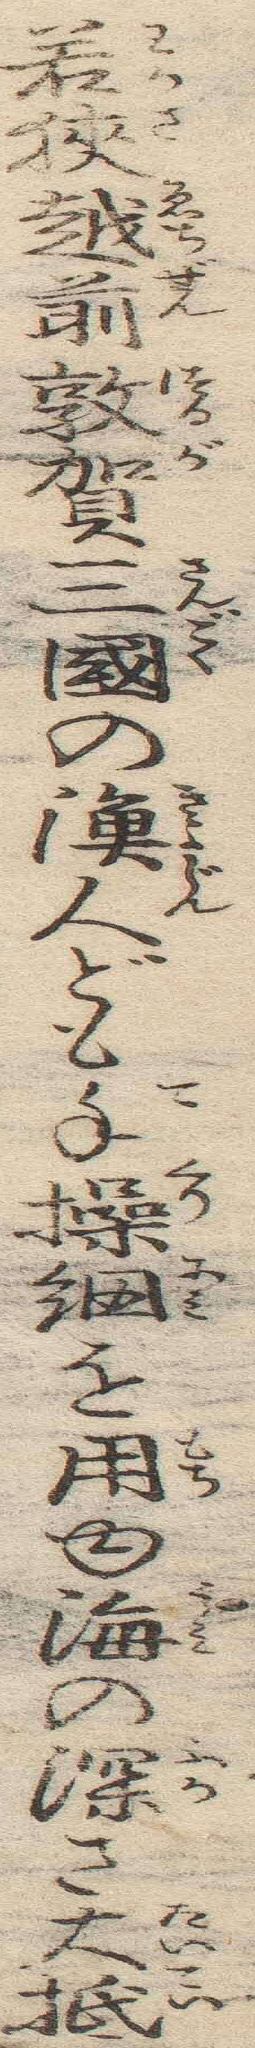若狭越前敦賀三国の漁人ども手操網を用ゆ海の深さ大抵
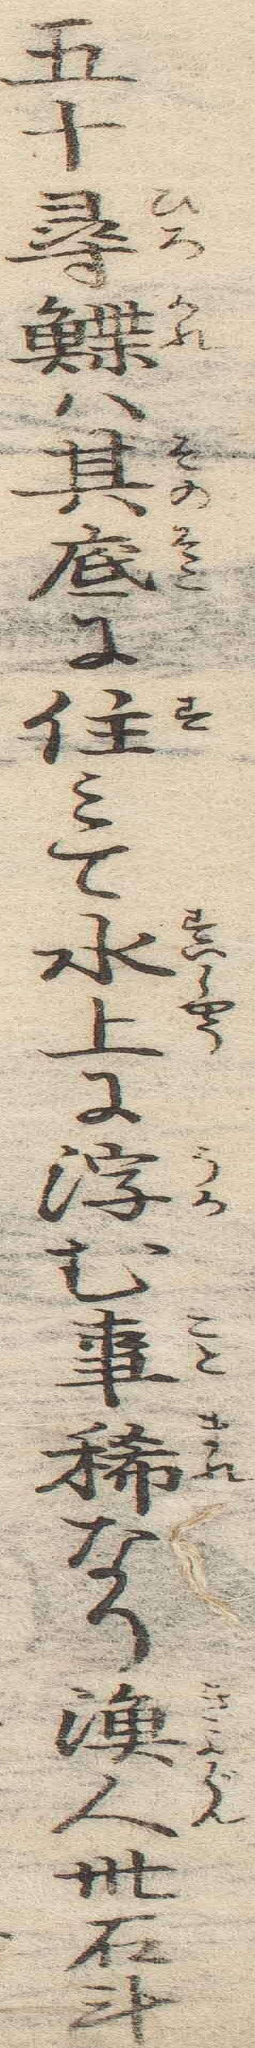五十尋鰈は其底に住みて水上に浮む事稀なり漁人卅石斗
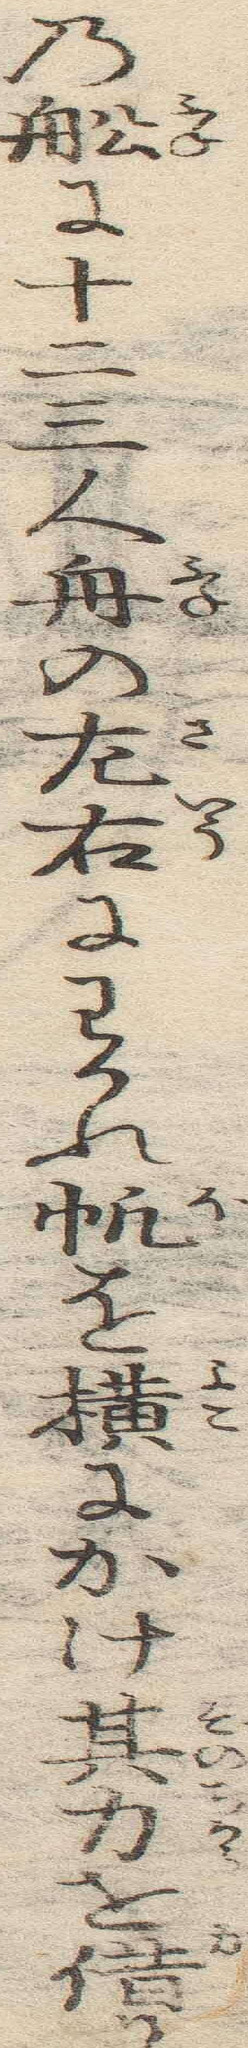の船に十二三人舟の左右にわかれ帆を横にかけ其力を借り
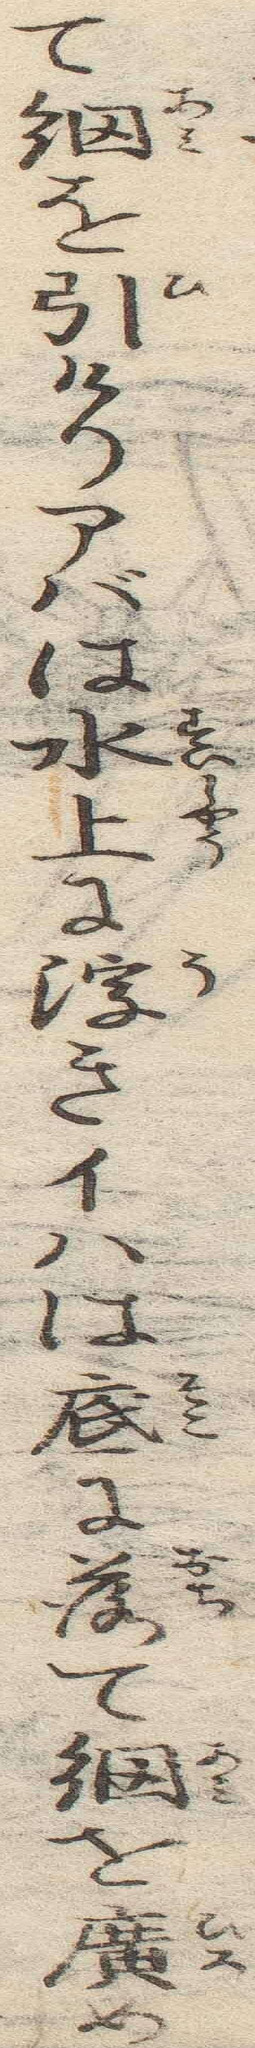て網を引けりアバは水上に浮きイハは底に落て網を広め
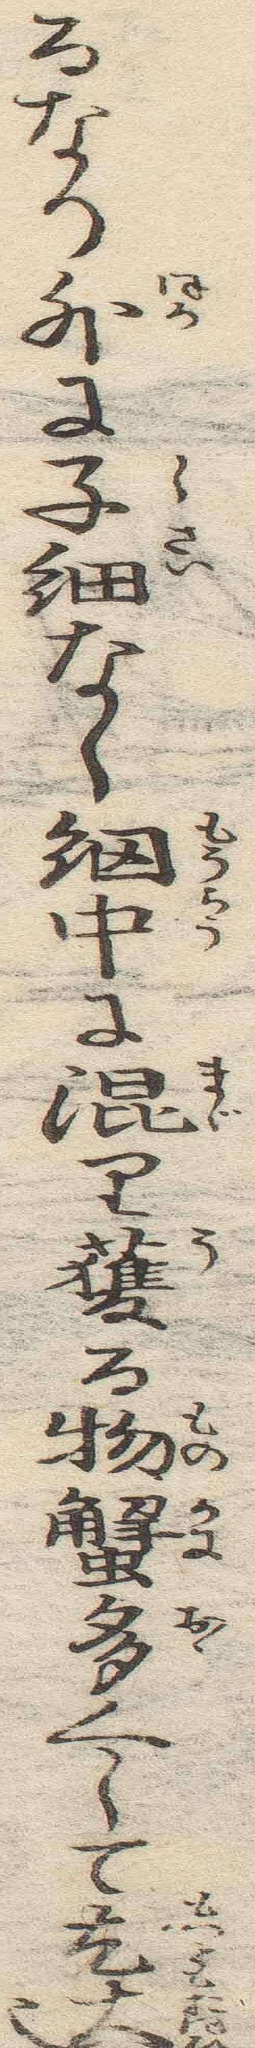るなり外に子細なし網中に混り獲る物蟹多くして尤大也
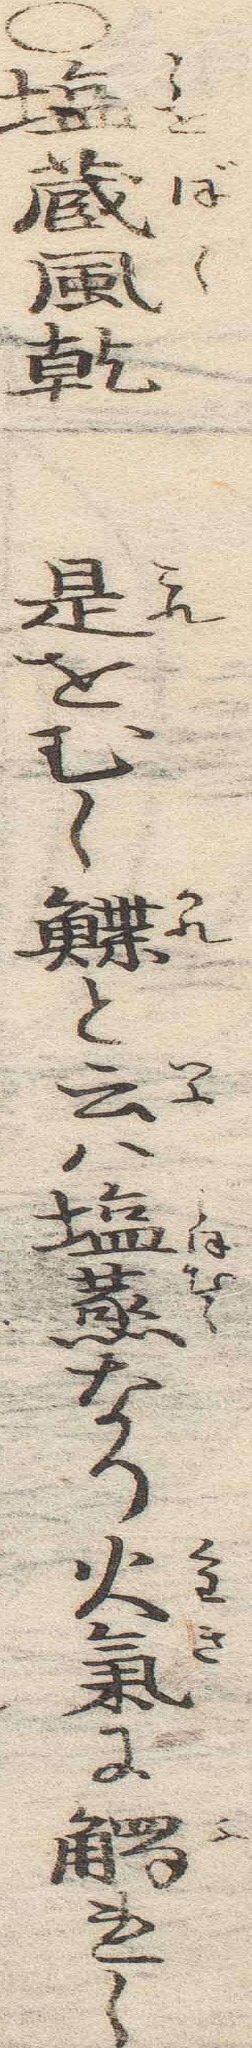○塩蔵風乾是をむし鰈と云は塩蒸なり火気に触れし
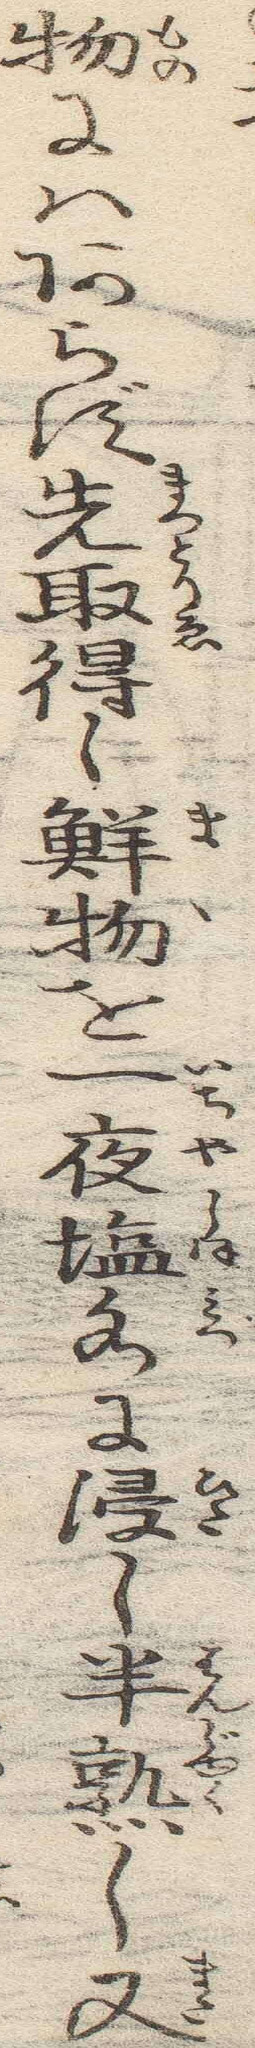物にはあらず先取得し鮮物を一夜塩水に浸し半熟し又
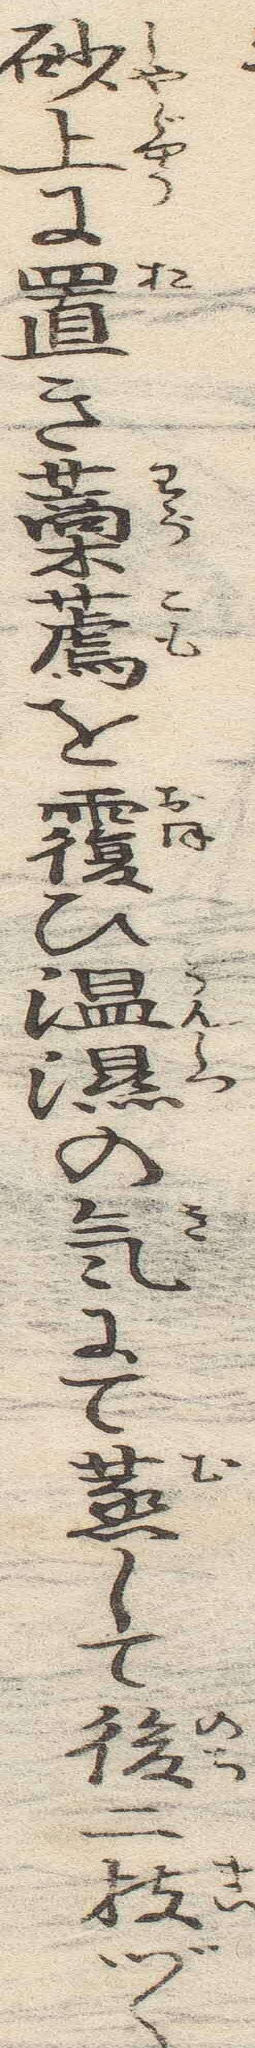砂上に置き藁薦を覆ひ温湿の気にて蒸して後二枚づゝ
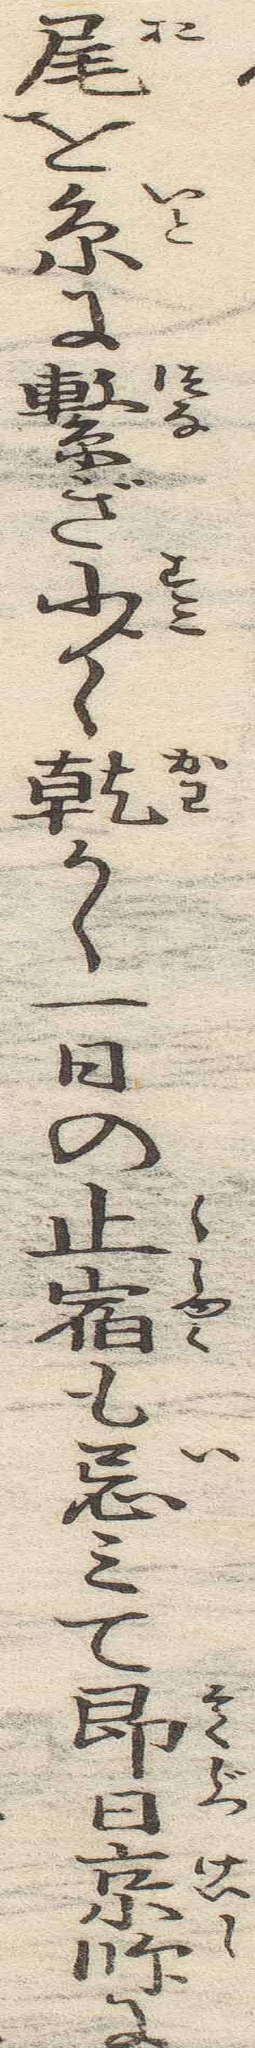尾を糸に繋ぎ少し乾かし一日の止宿も忌みて即日京師に
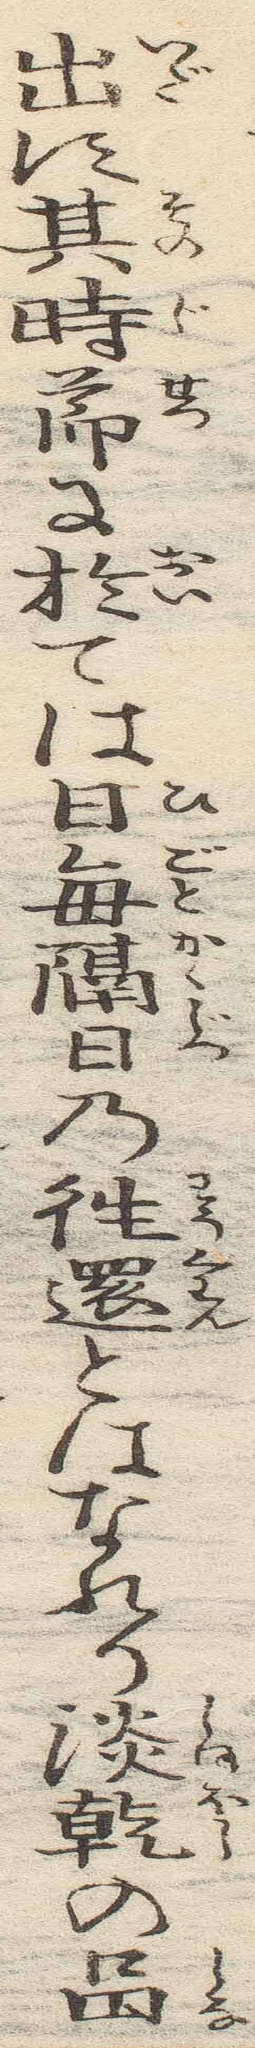出す其時節に於ては日毎隔日の往還とはなれり淡乾の品
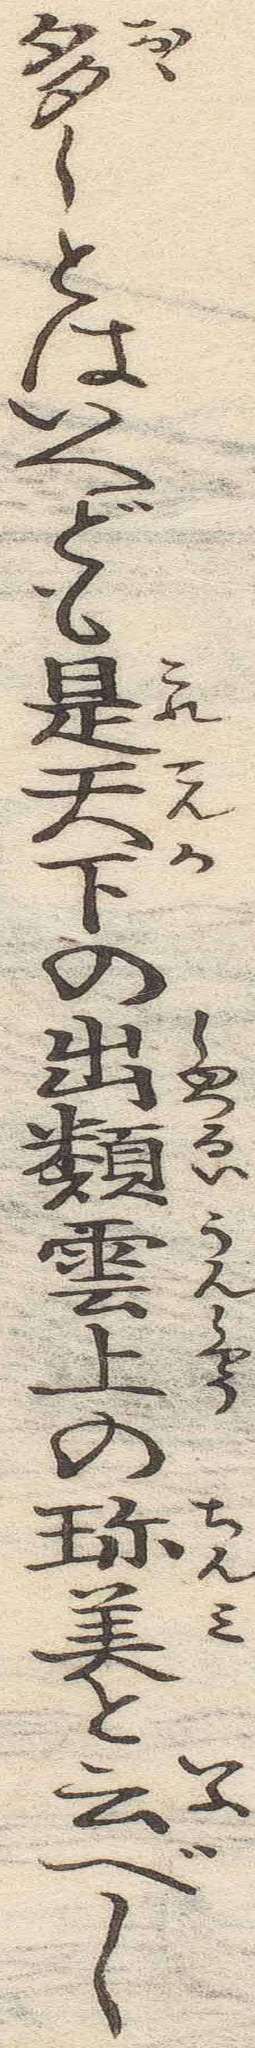多しとはいへども是天下の出類雲上の珍美と云べし
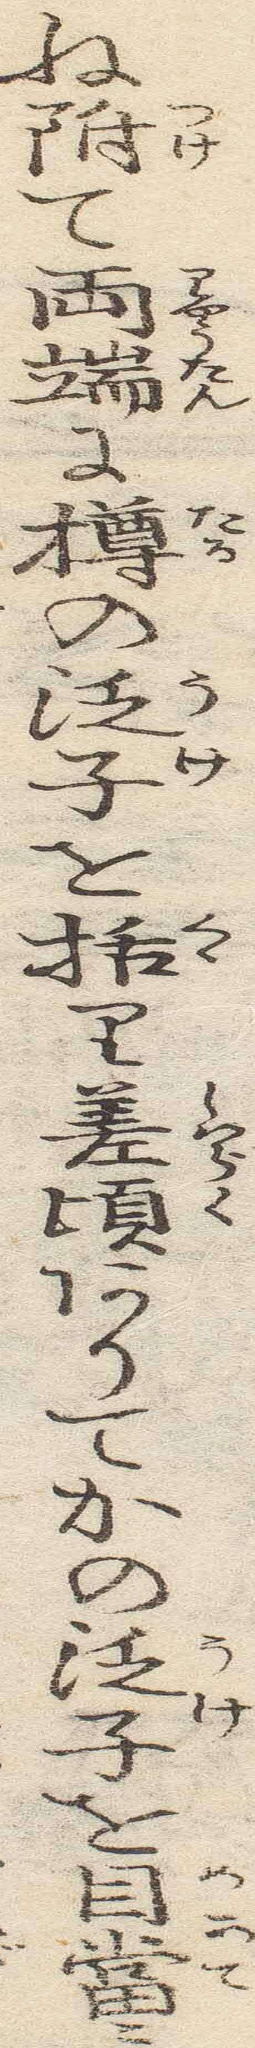ね附て両端に樽の泛子を括り差頃ありてかの泛子を目当に
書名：日本山海名産図会
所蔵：東京学芸大学附属図書館 国文学研究資料館
